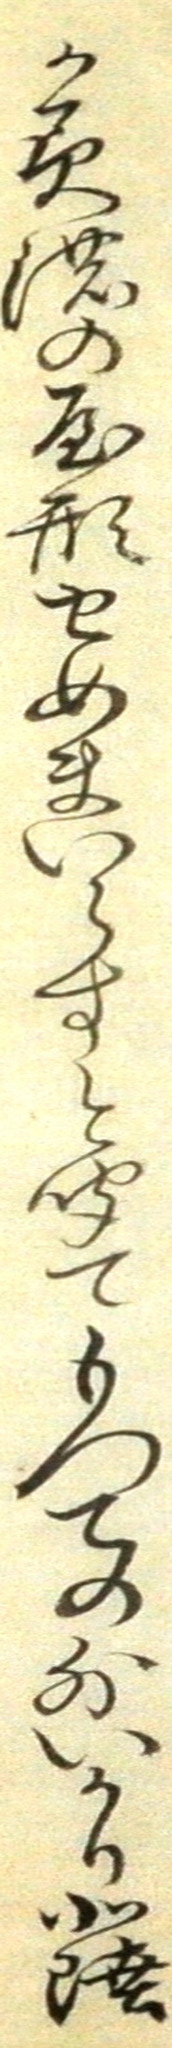か美濃の屋形せめまいらすと聞てもつての外いかり北陸
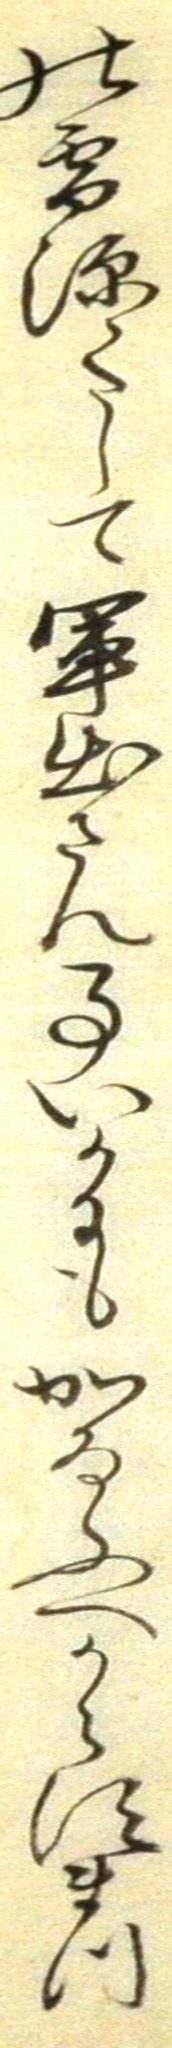の雪深くして軍出さん事いかにもかなふへからすまつ
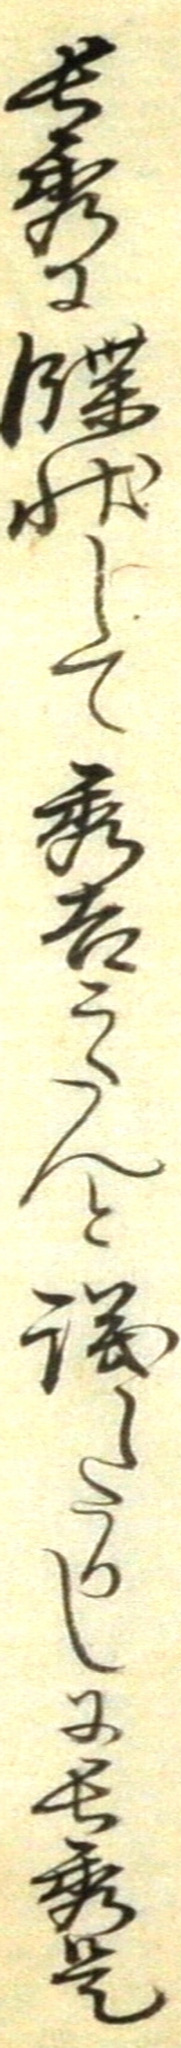長秀に牒状して秀吉うたんと議したりしに長秀是
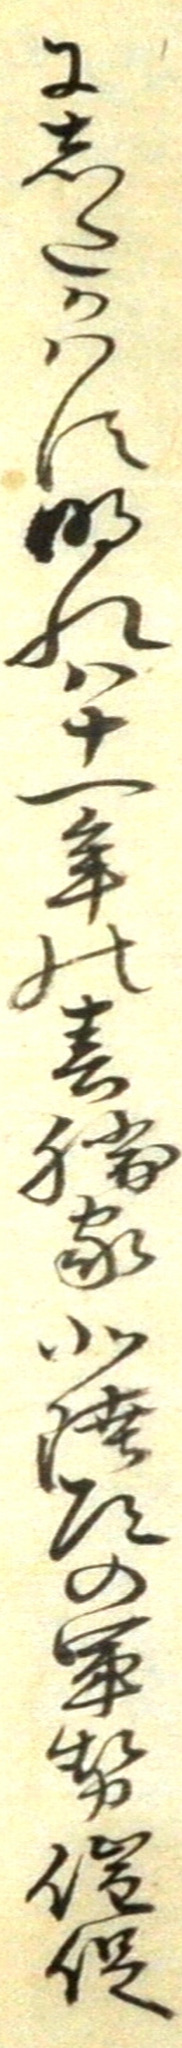にしたかはす明れは十一年の春勝家北陸道の軍勢催促
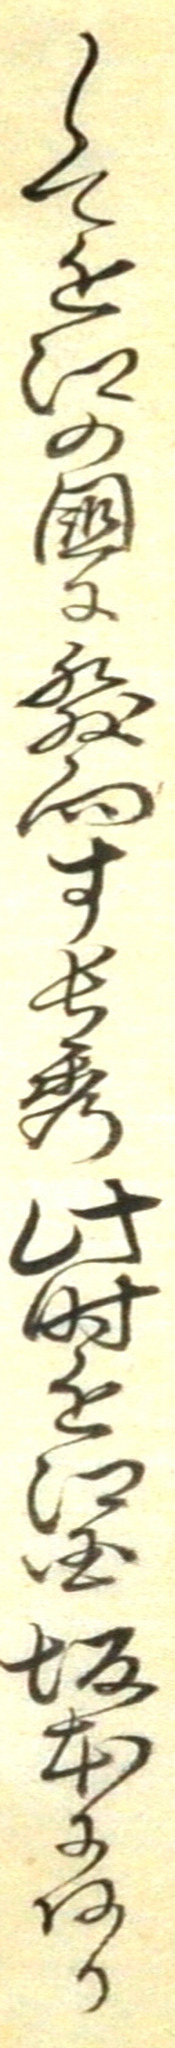して近江の国に発向す長秀此時近江国坂本にあり
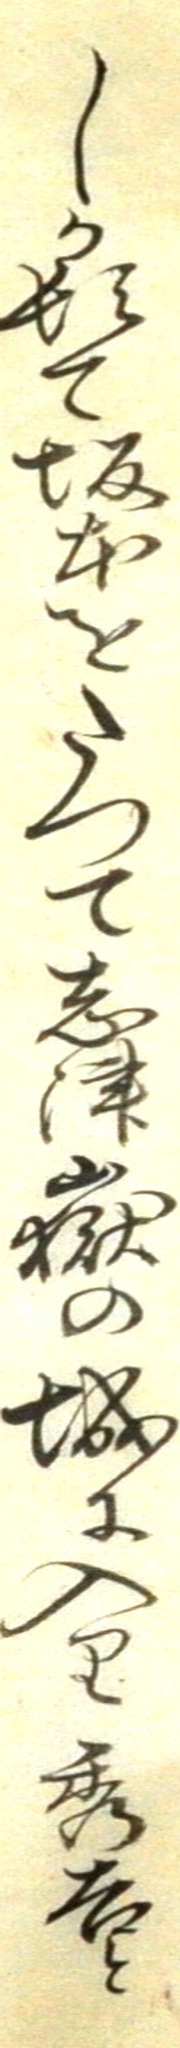しか頓て坂本をたつて志津嶽の城に入り秀吉と
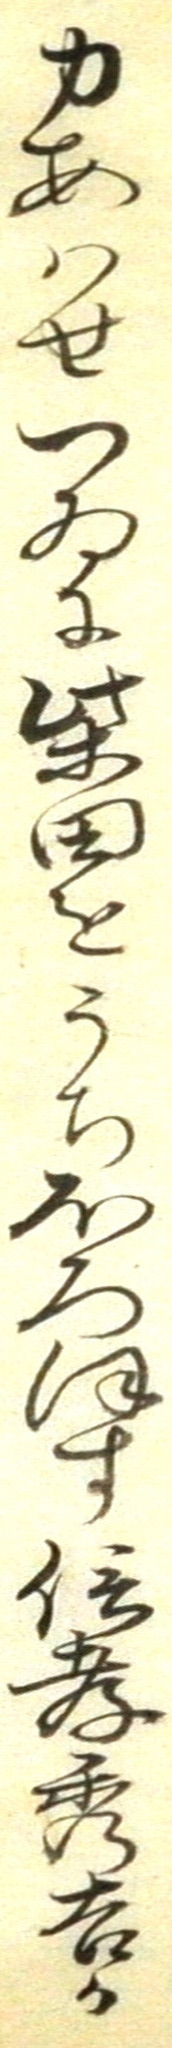力あはせつゐに柴田をうちほろほす信孝秀吉か
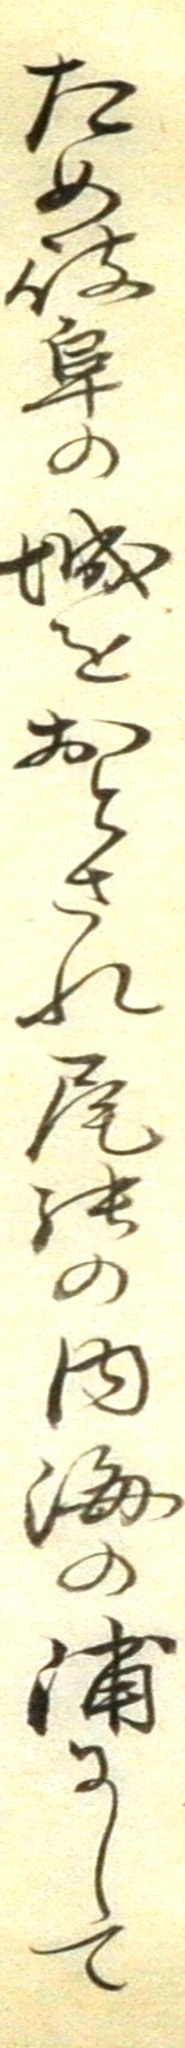ため岐阜の城をおとされ尾張の内海の浦にして
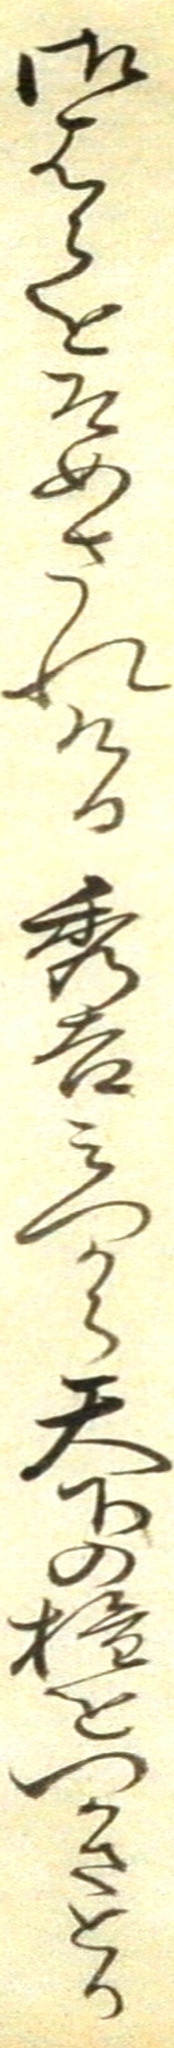御はらをそめされける秀吉みつから天下の権をつかさとり
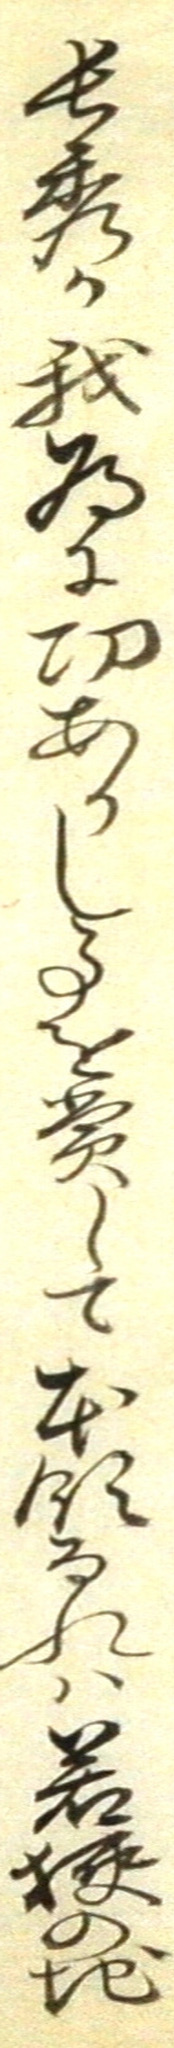長秀か我為に功ありし事を賞して本領なれは若狭の地
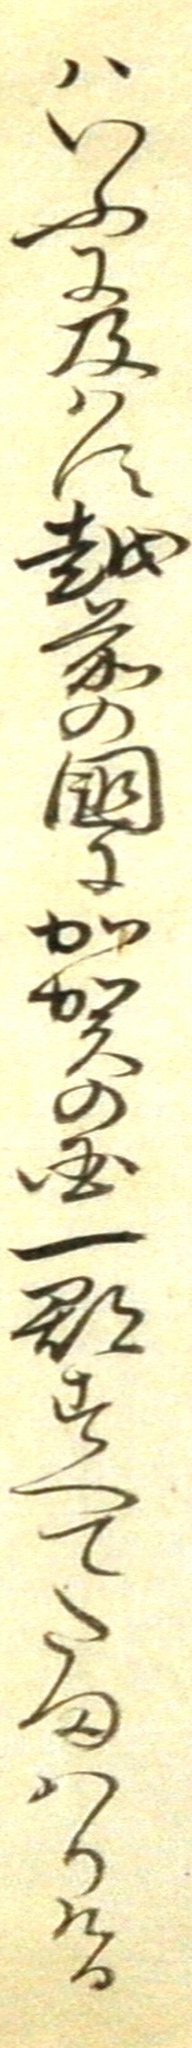はいふに及はす越前の国に加賀の国一郡すへてたまはりける
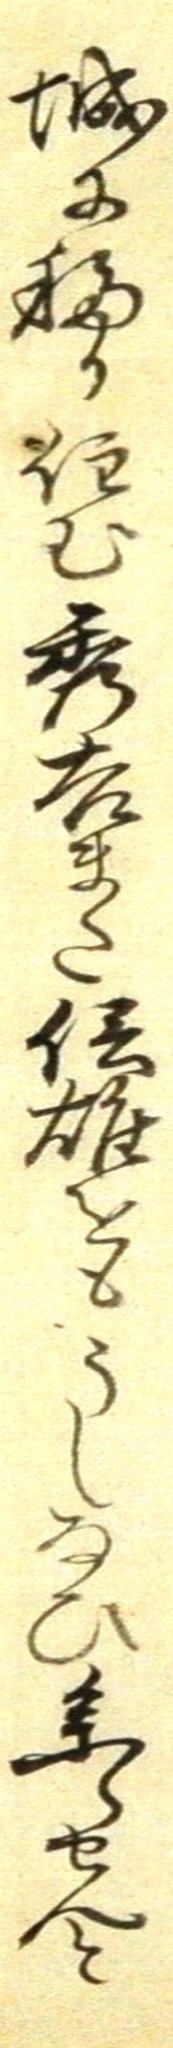城に移り住む秀吉また信雄をもうしなひ参らせんと
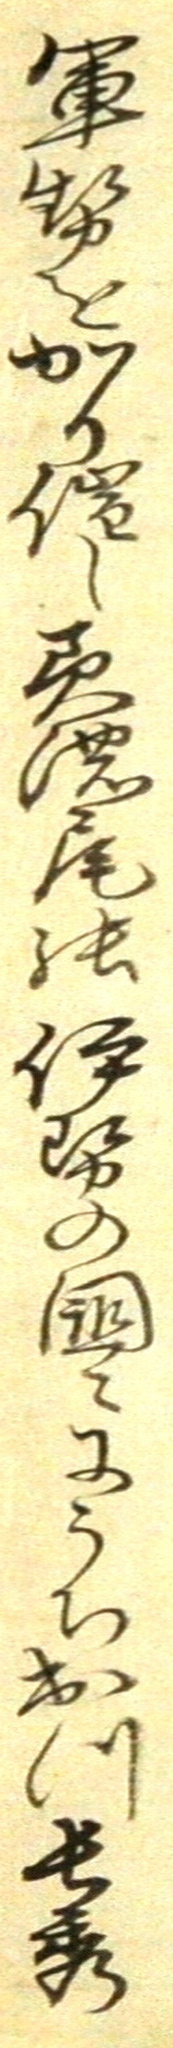軍勢をかり催し美濃尾張伊勢の国々にうち出つ長秀

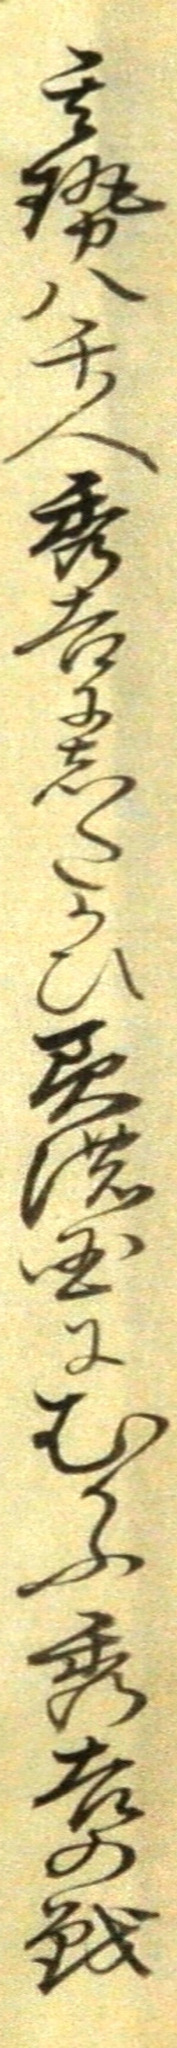其勢八千人秀吉にしたかひ美濃国にむかふ秀吉の戦
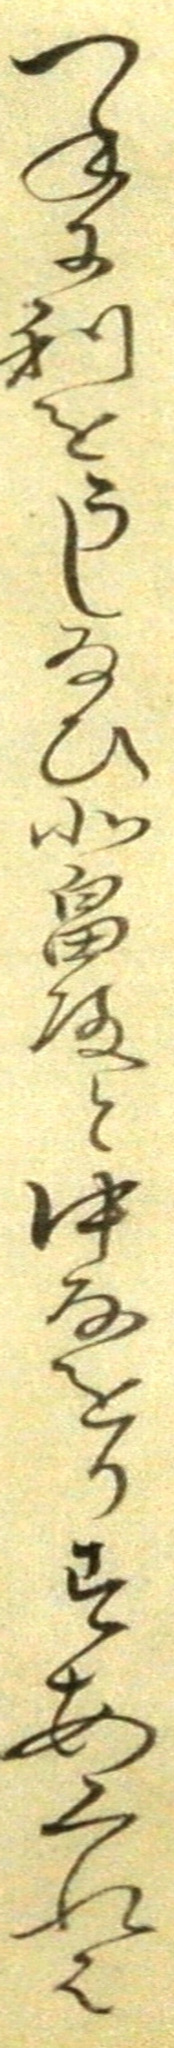つねに利をうしなひ北畠殿と中なをりすあくれは
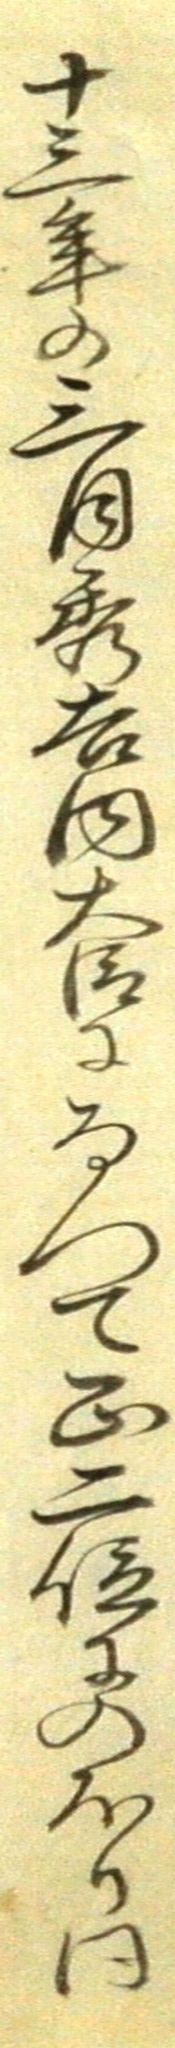十三年の三月秀吉内大臣になつて正二位にのほり同
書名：藩翰譜（八・下）
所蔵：伊那市立高遠町図書館・合同会社AMANE
